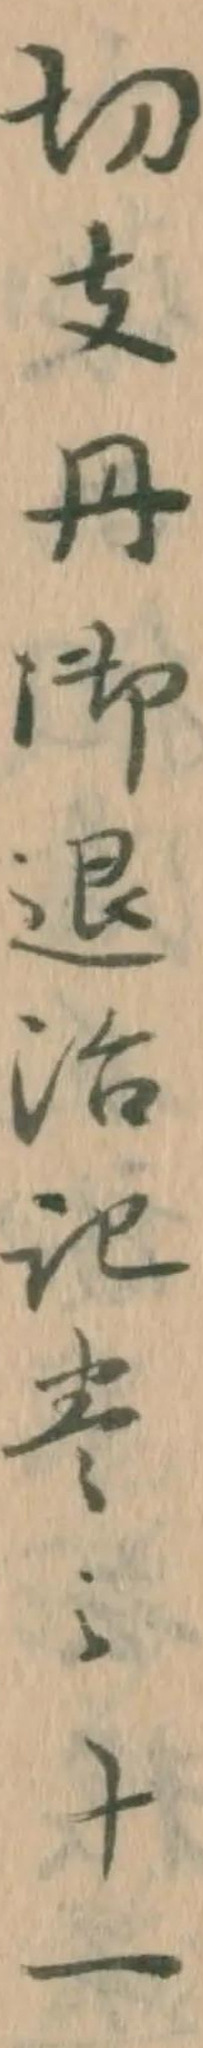切支丹御退治記巻之十一
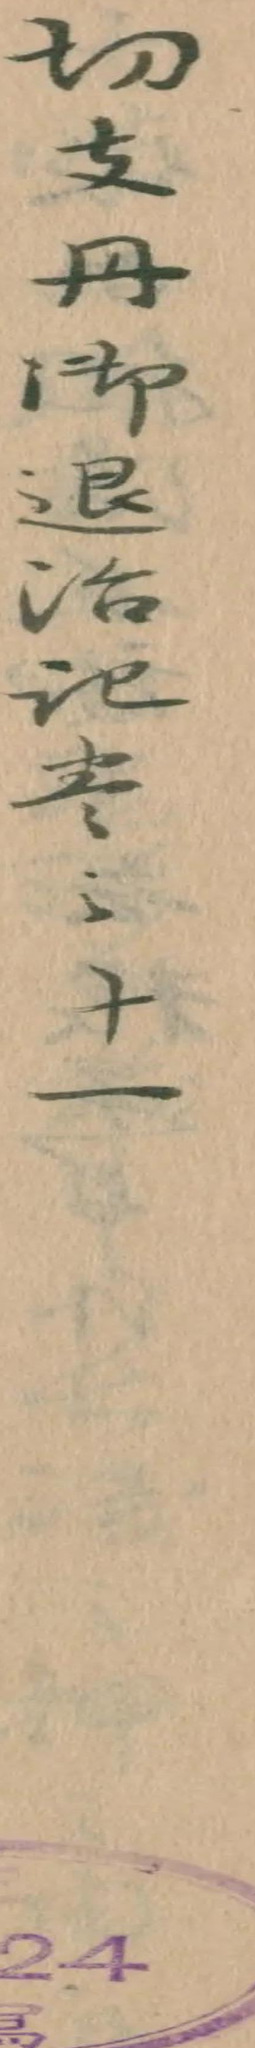切支丹御退治記巻之十一
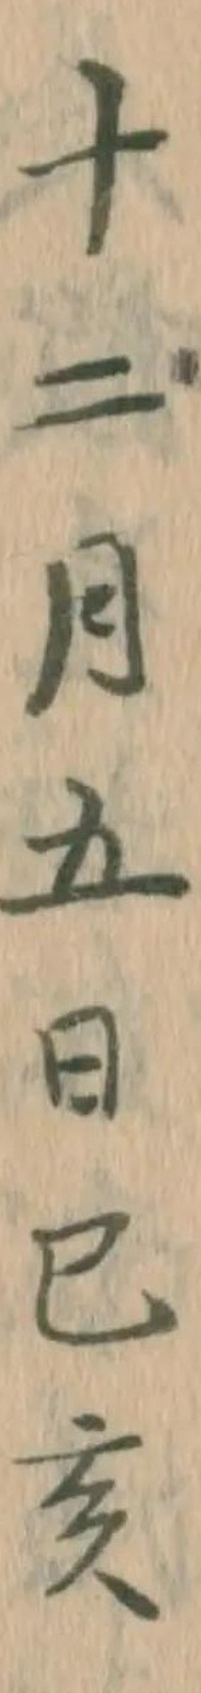十二月五日巳亥
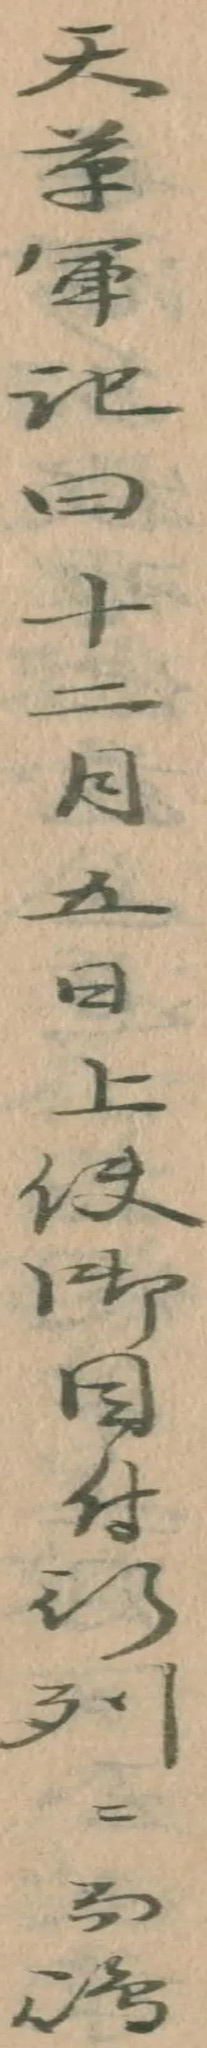天草軍記曰十二月五日上使御目付行列に而島
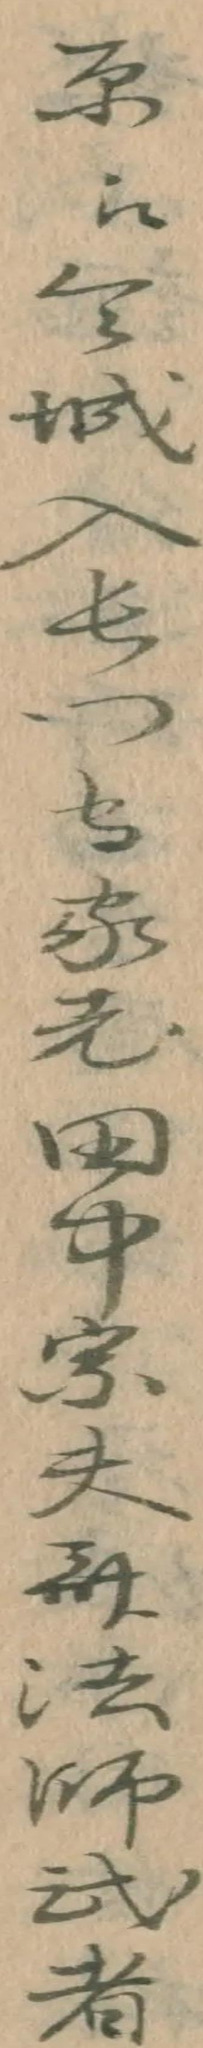原江令城入長門守家老田中宗夫斎法師武者
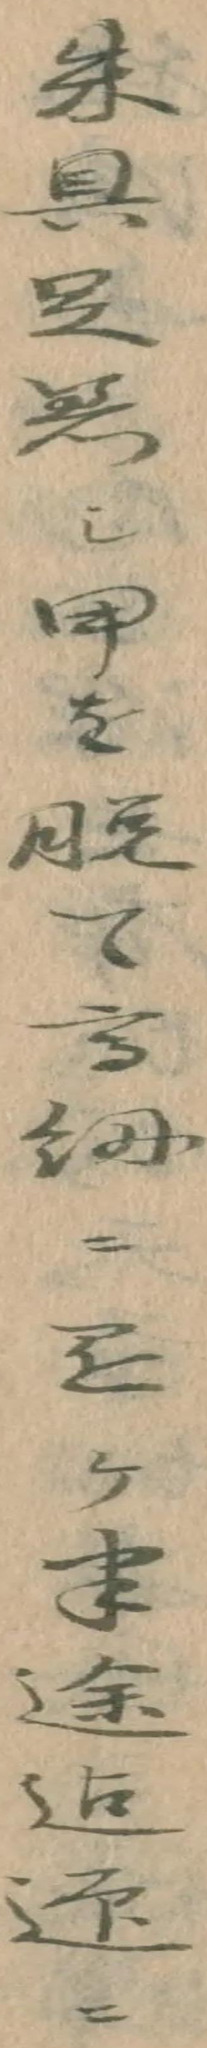朱具足着し甲を脱て高紐に懸け半途迄迎に
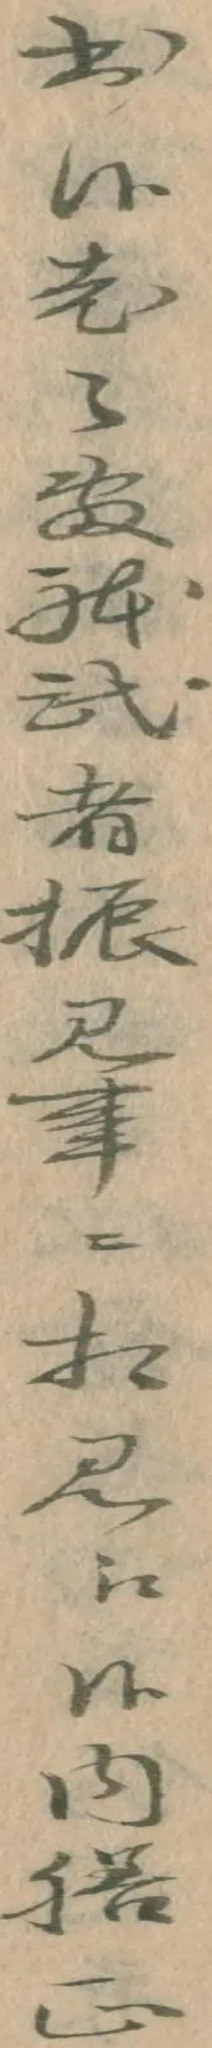出候老々敷体武者振見事に相見江候内膳正
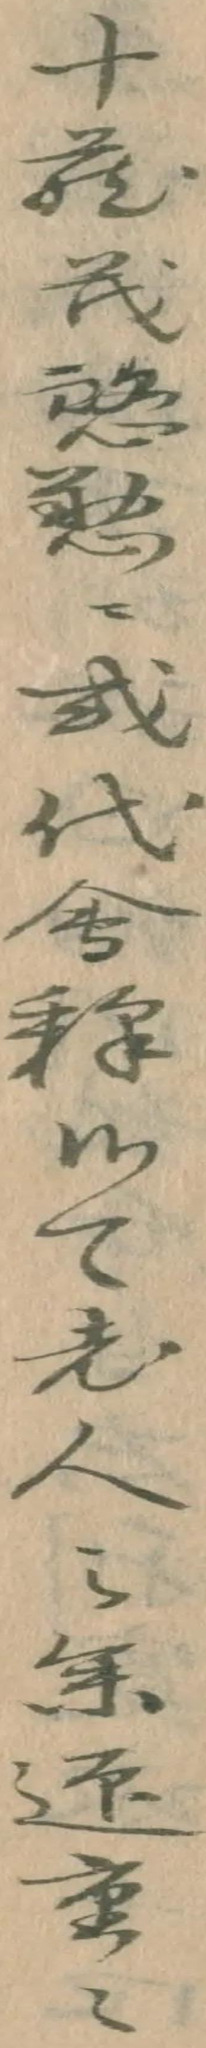十蔵も慇懃に或代会釈候て老人之参迎重々
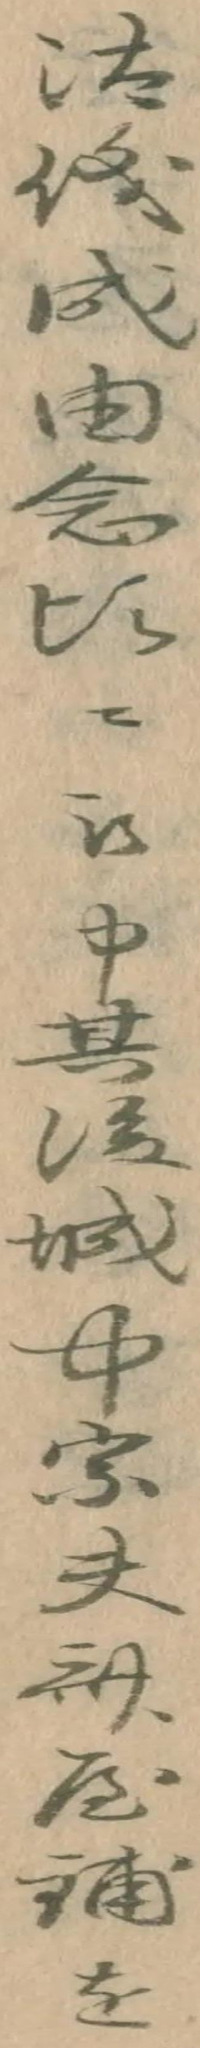汰儀成由念頃に被申其後城中宗夫斎屋鋪を
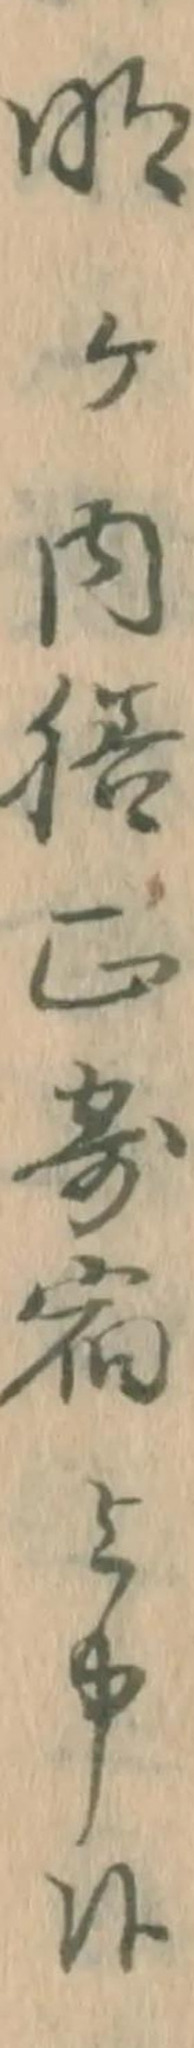明け内膳正寄宿と申候

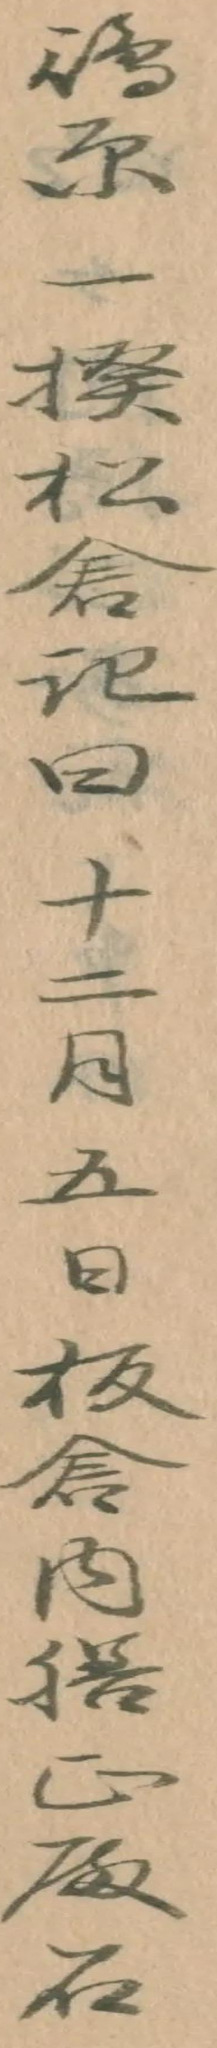島原一揆松倉記曰十二月五日板倉内膳正殿石
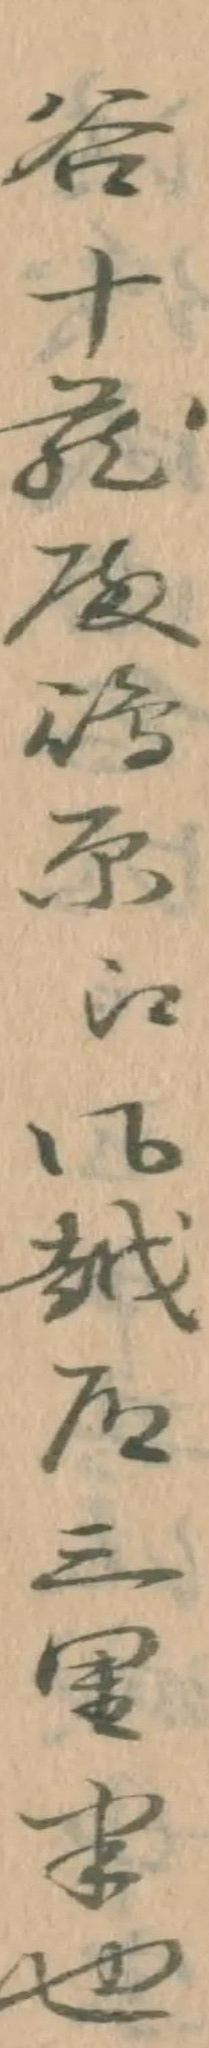谷十蔵殿島原江御越道三里半也
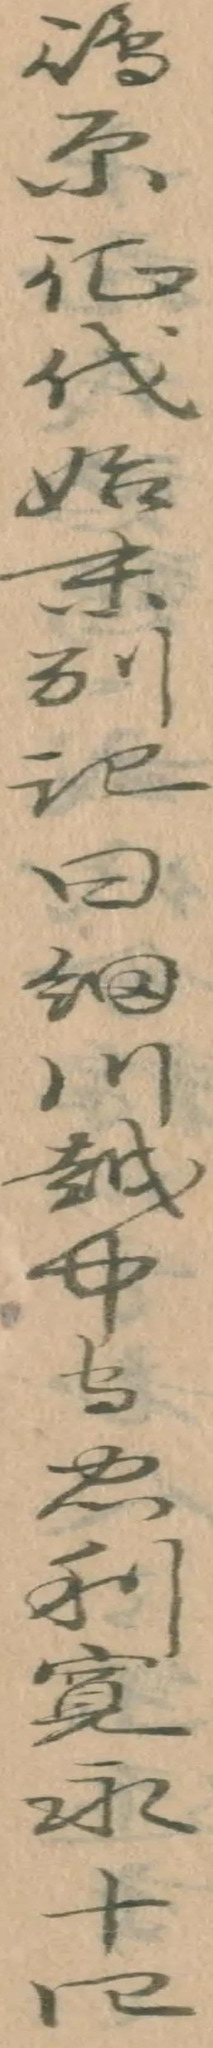島原征伐始末別記曰細川越中守忠利寛永十四
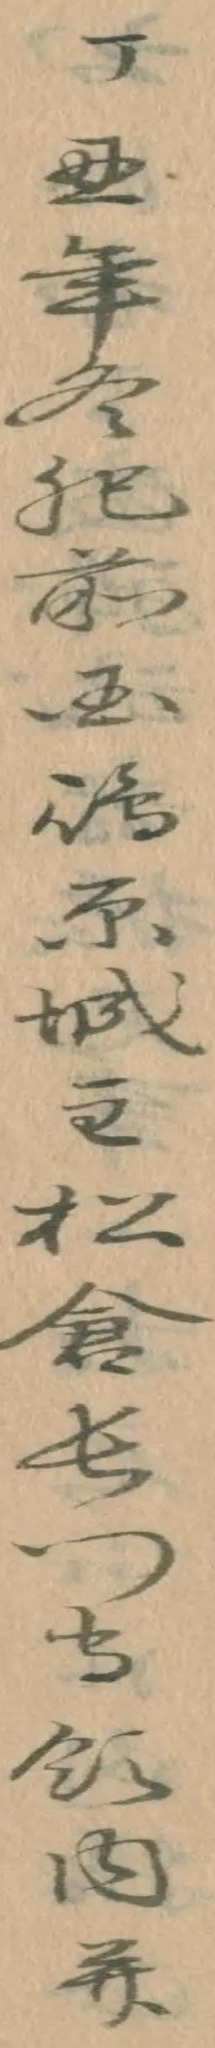丁丑年冬肥前国島原城主松倉長門守領内并
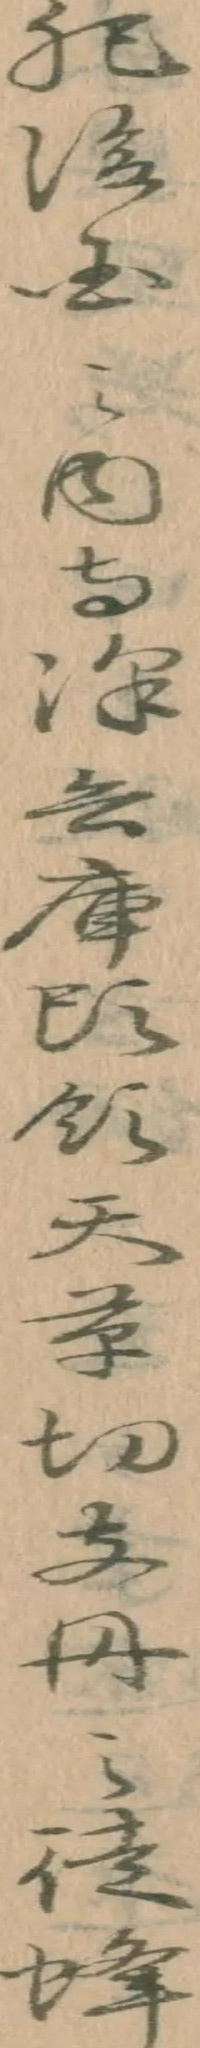肥後国之内寺沢兵庫頭領天草切支丹之徒蜂
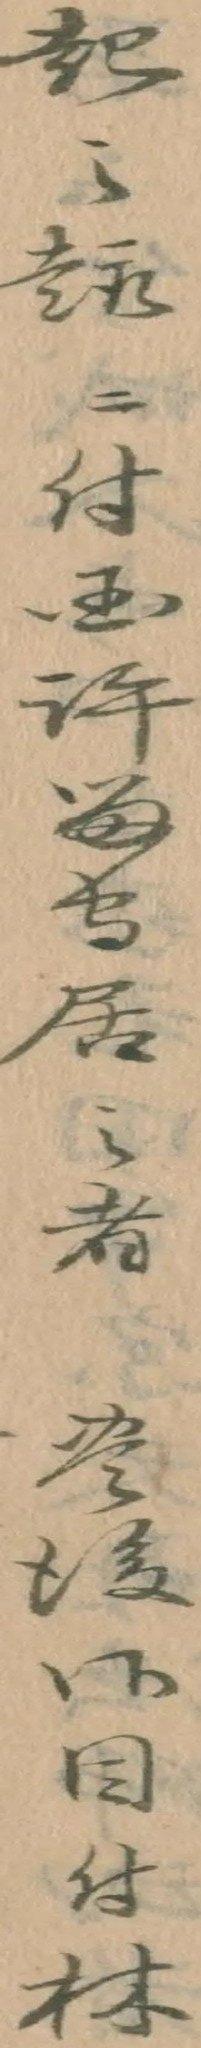起之趣に付国許留守居之者豊後御目付林
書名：切支丹御退治記 49巻. [3]
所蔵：国立国会図書館 National Diet Library, JAPAN
